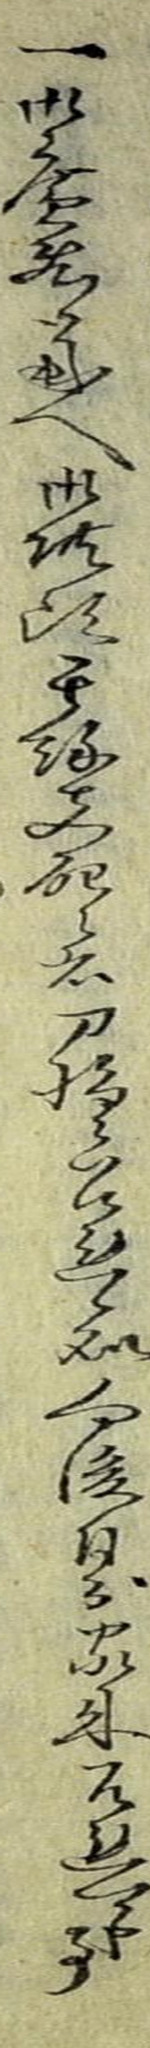一御広敷御用人御供頭其餘支配之者刀指に召連候処向後自分家来召連可申事
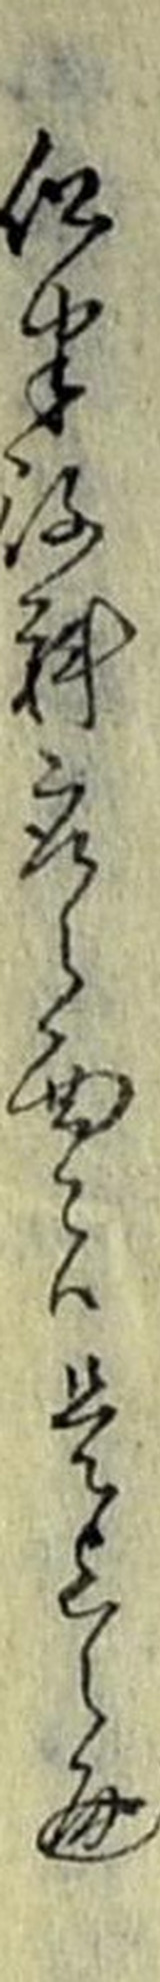但半役料取之面々は是迄之通
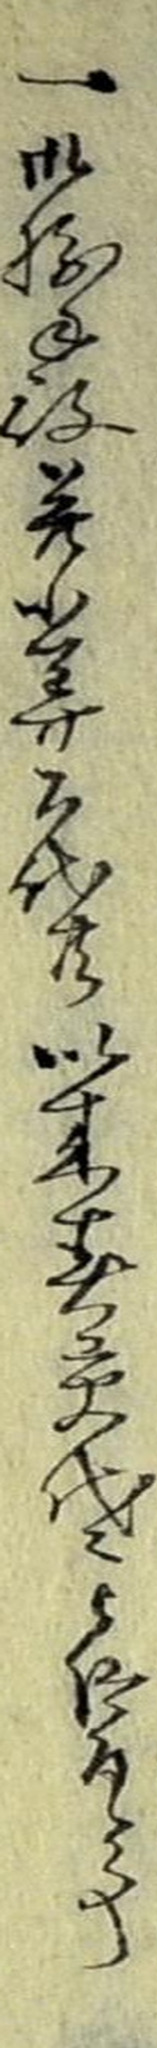一御勝手役并小算下代共以來春交代に被仰付候事
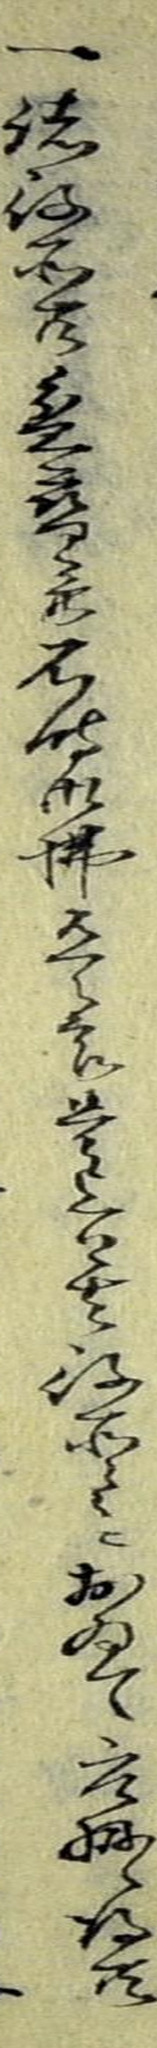一諸役所共盆暮并不時御払有之節是迄は其役所々々におゐて取扱候得共
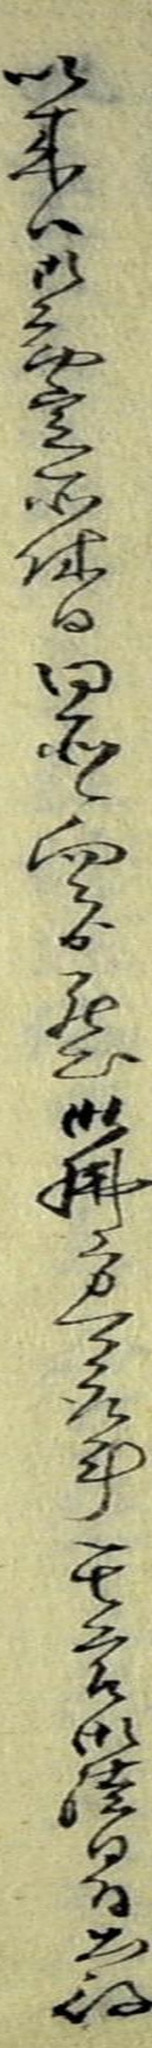以來は御勘定所休日同所へ向々ゟ罷出御払ハ來方可取斗其節御徒目付出役

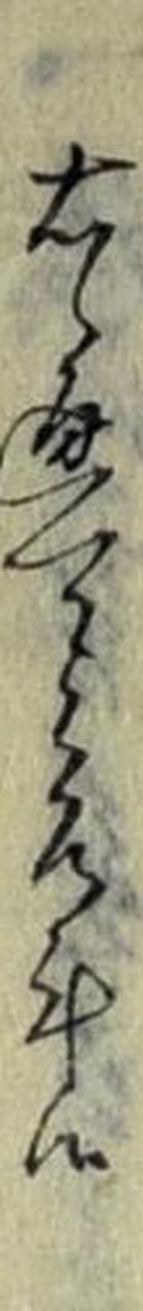右之通被取斗候
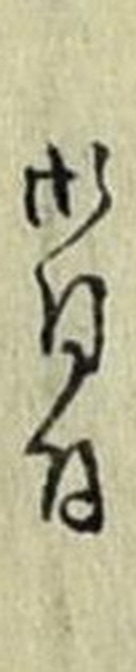御目付
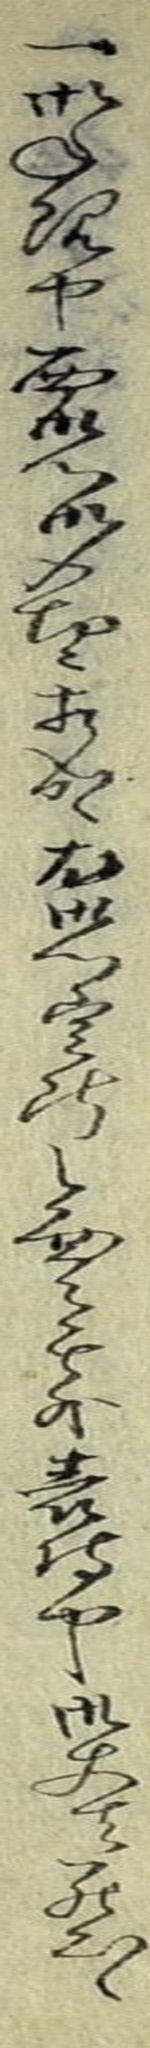一御年限中西御門御〆切に相成候尤御門定断之面々其外表侍中御使者罷出候
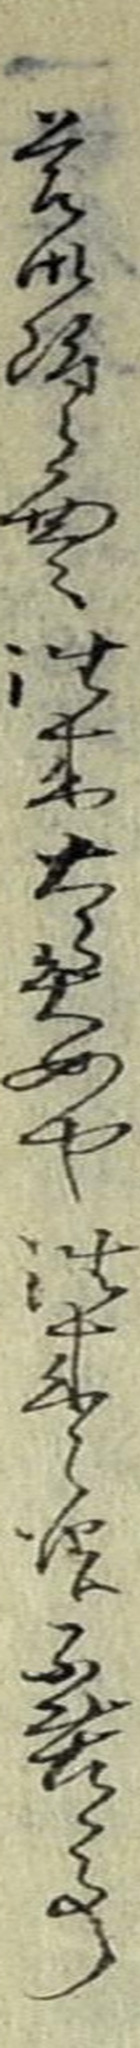節御附之面々往来大奥女中往来之儀は不苦候事
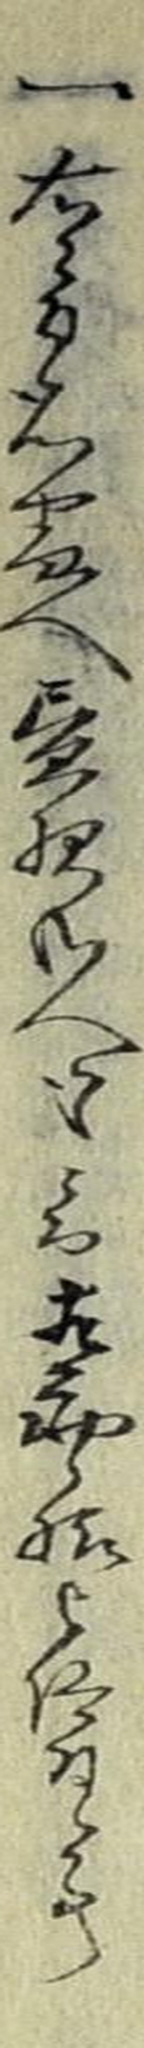一右に付御門番人昼夜弐人つゝに而相勤候様被仰付候事
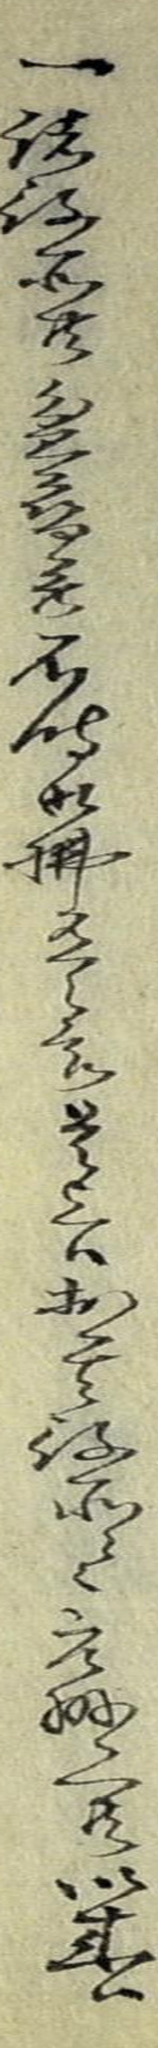一諸役所共盆暮并不時御払有之節是迄は於其場所〳〵取扱候へ共以來は
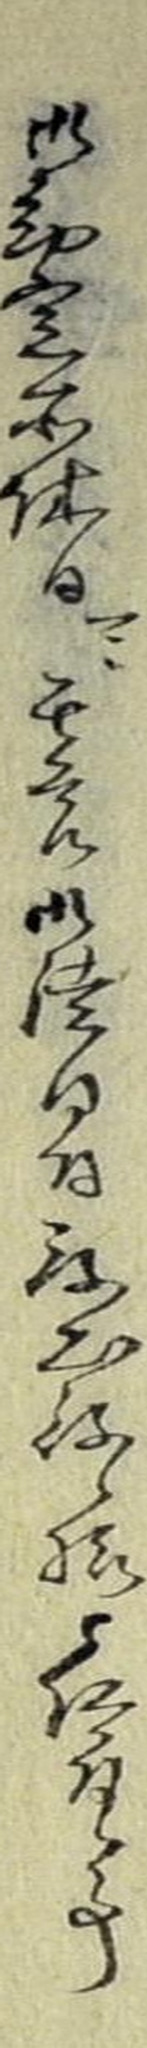御勘定所休日マゝ其節御徒目付致出役候様被仰付候事
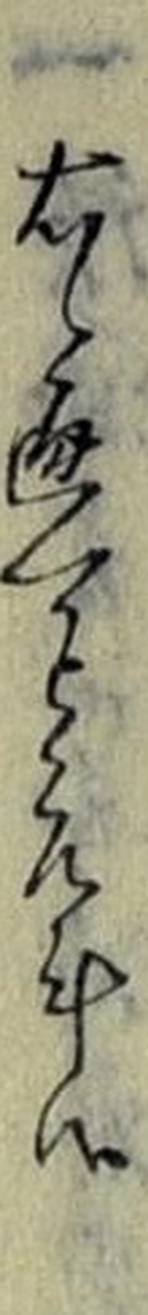右之通被取斗候
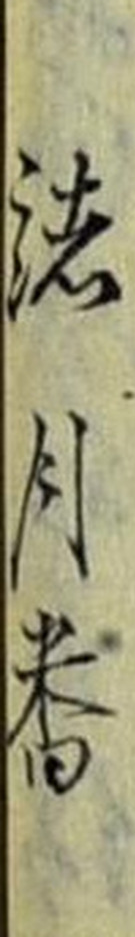諸月番
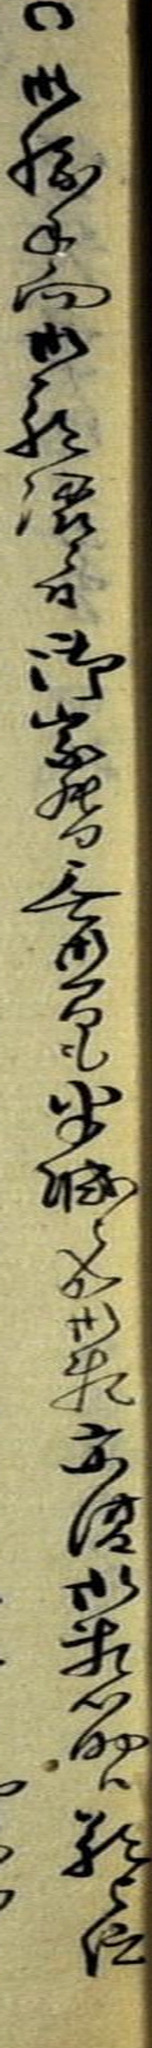○御勝手向御難渋に付御家督無御間も半減被成御頼亦復御頼筋は難被仰
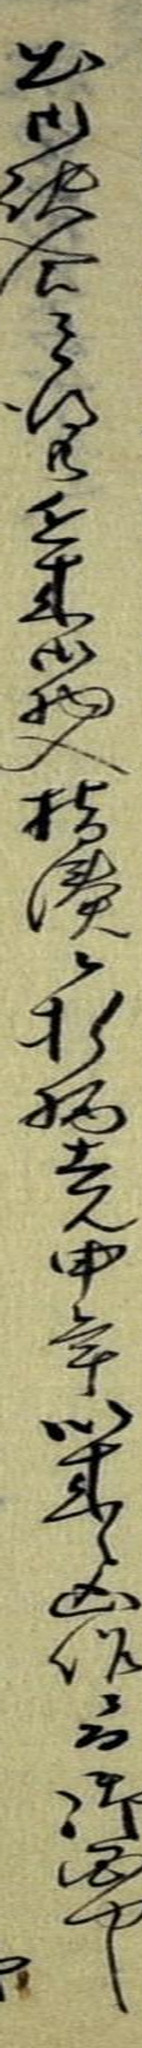出御訳合に候得共近来御物入指湊候折柄去ル申年以來之凶作に而御国中
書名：命令之部 六
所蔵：福井県文書館 Fukui Prefectural Archives
